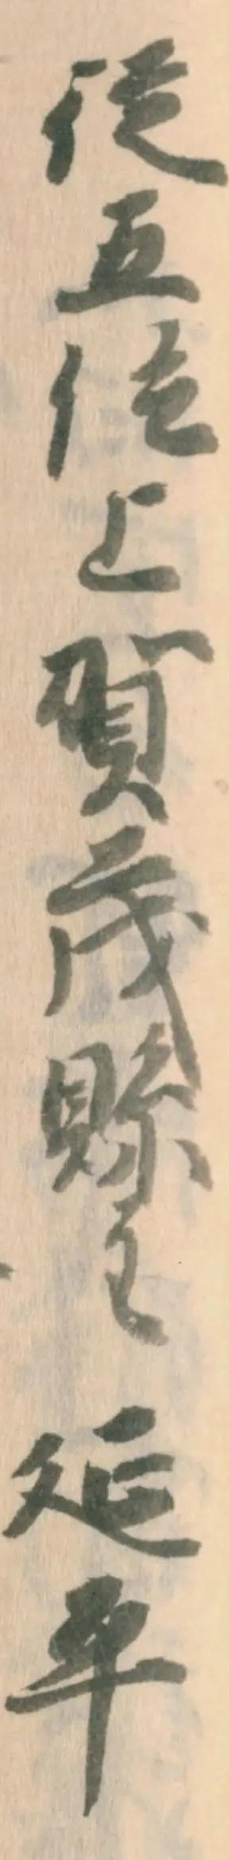従五位上賀茂県主延平
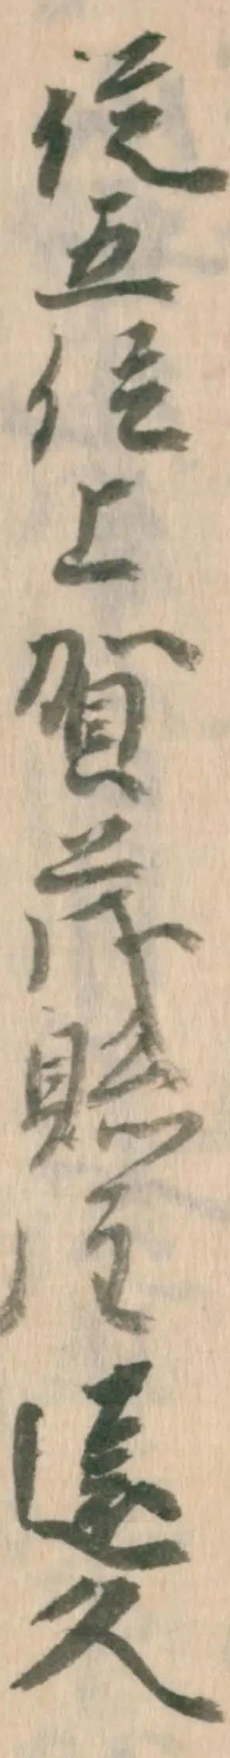従五位上賀茂県主遠久
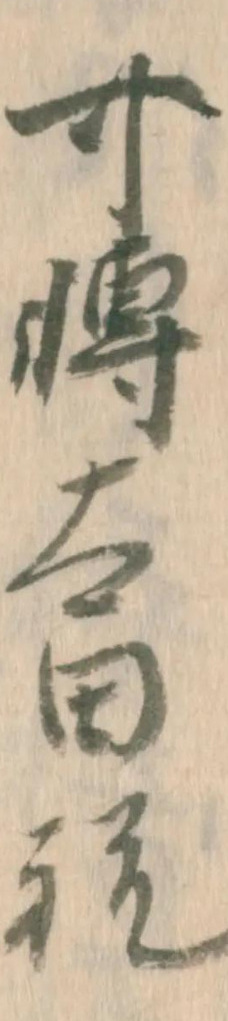可転太田祝
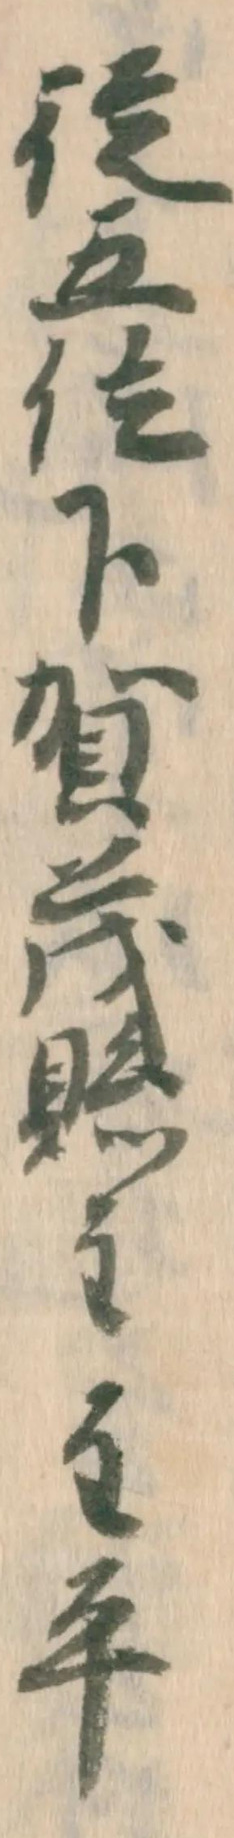従五位下賀茂県主主平
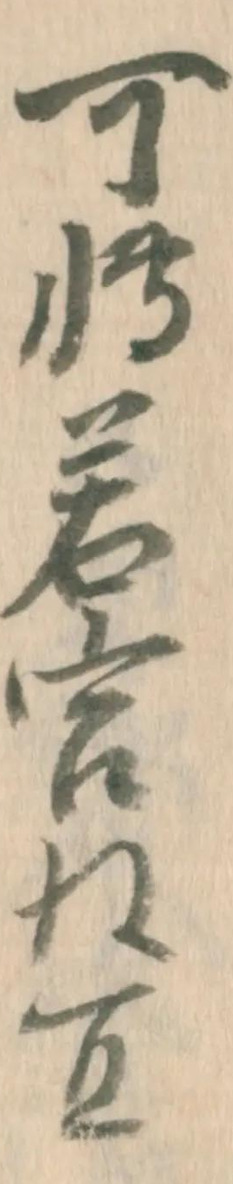可転若宮ね宜
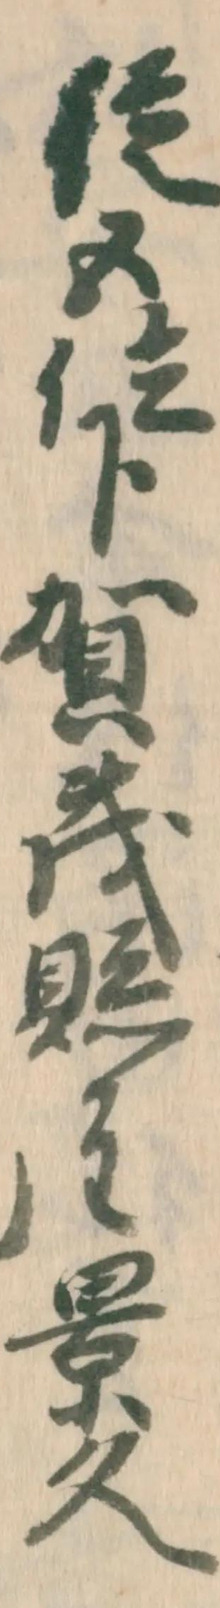従五位下賀茂県主景久
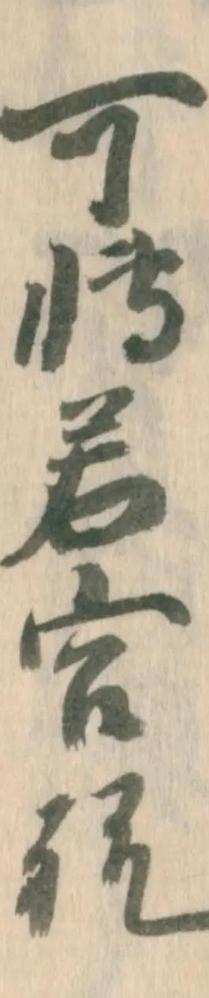可転若宮祝
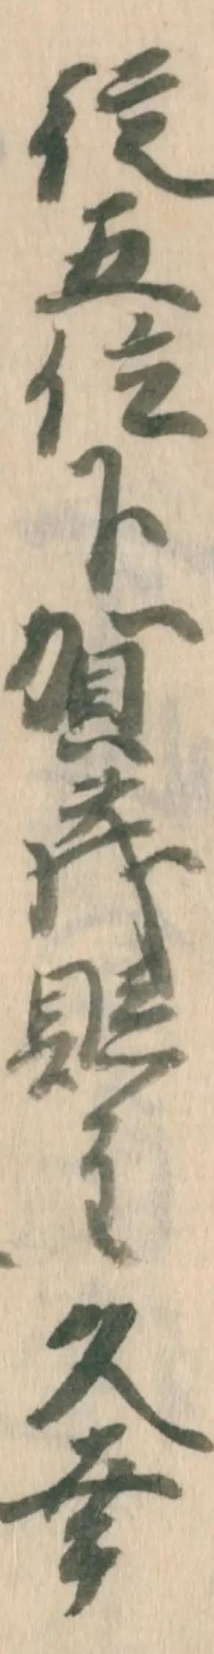従五位下賀茂県主久幸

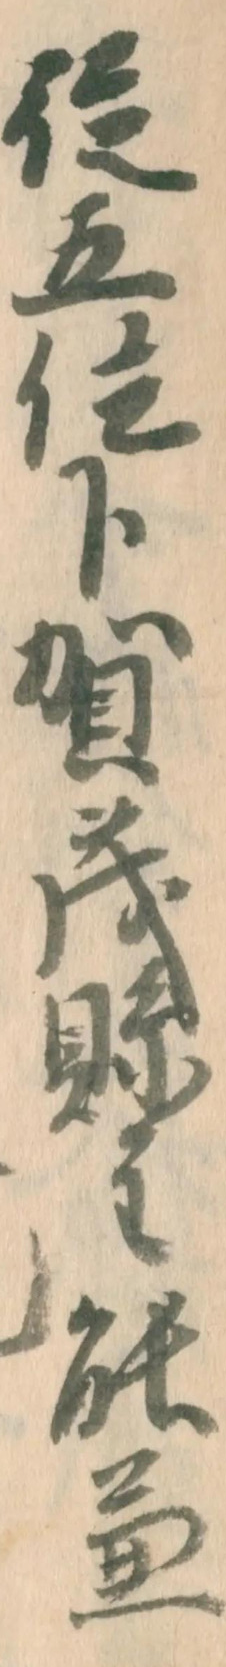従五位下賀茂県主能兼
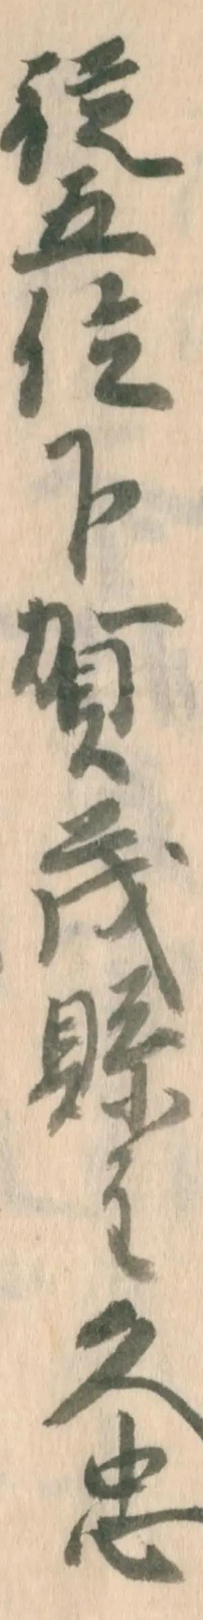従五位下賀茂県主久忠
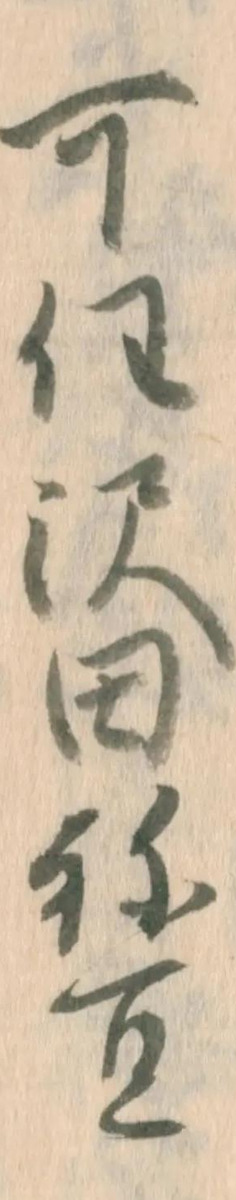可任沢田祢宜
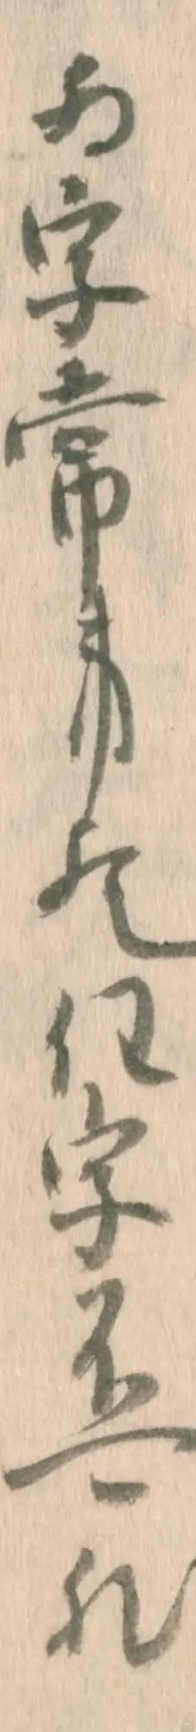為字常事歟任字不可然
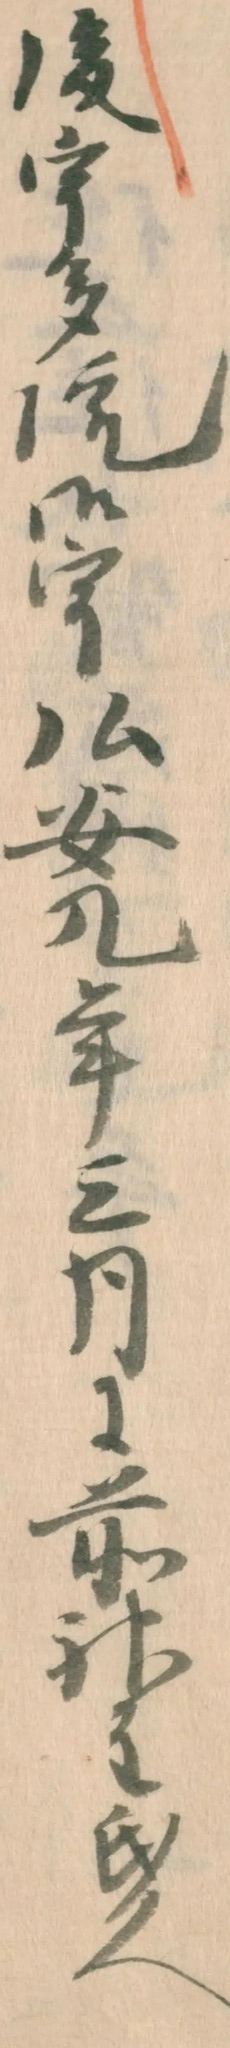後宇多院御宇弘安九年三月に前神主氏久
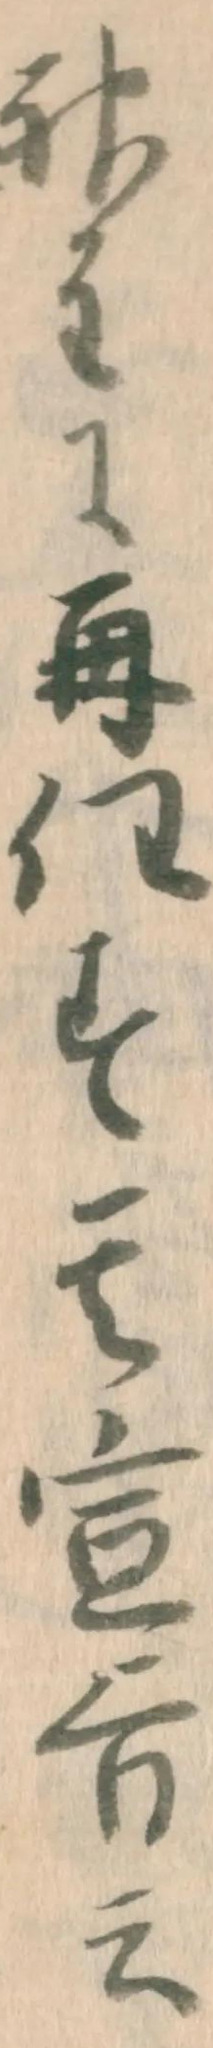神主に再任す其宣旨云
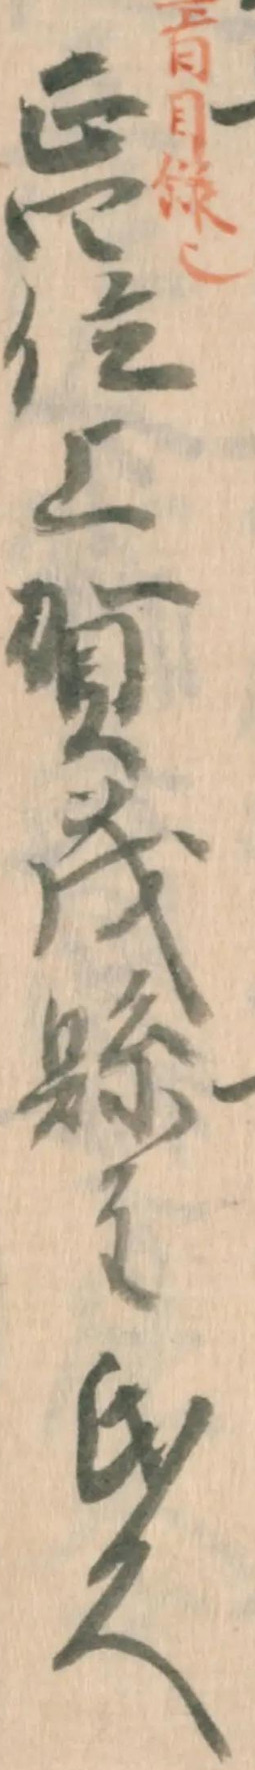正四位上賀茂県主氏久
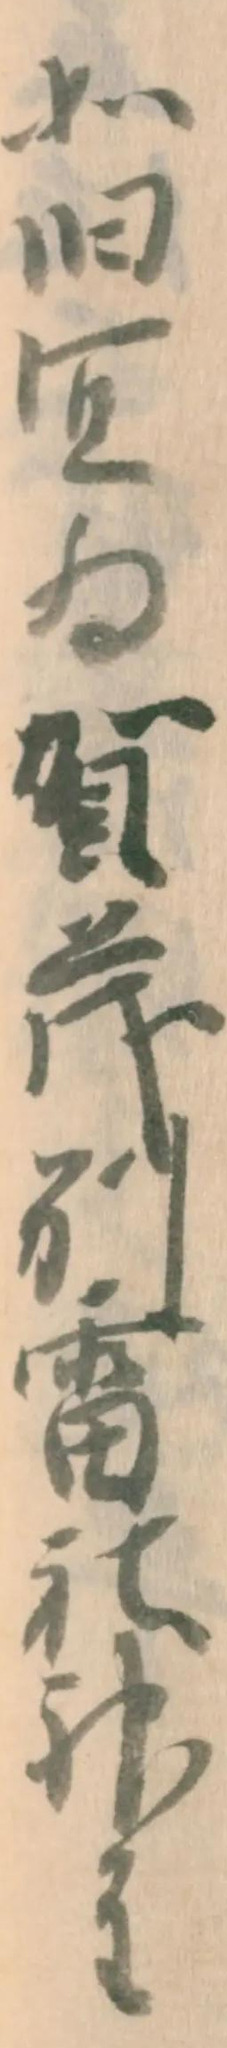如旧宜為賀茂別雷社神主
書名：賀茂社記録. 第1冊
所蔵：国立国会図書館 National Diet Library, JAPAN
